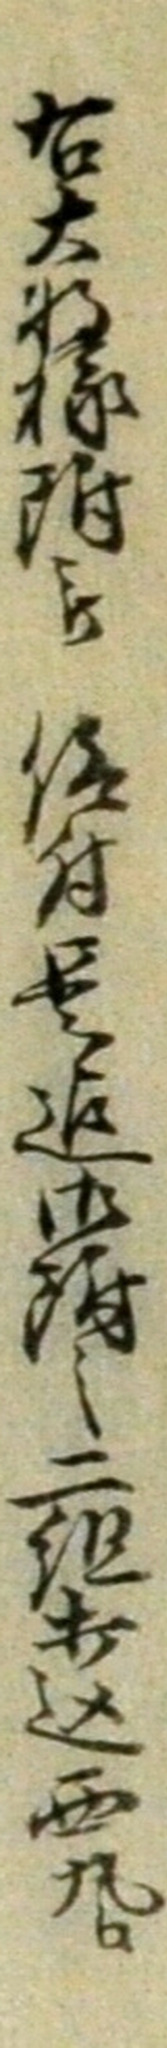右大将様附被仰付是迄御附之二組打込西丸江
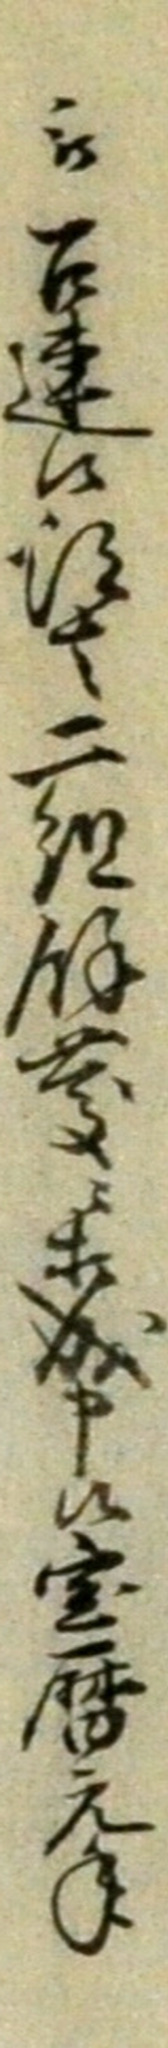被召連候得者二組餘慶ニ相成申候宝暦元年
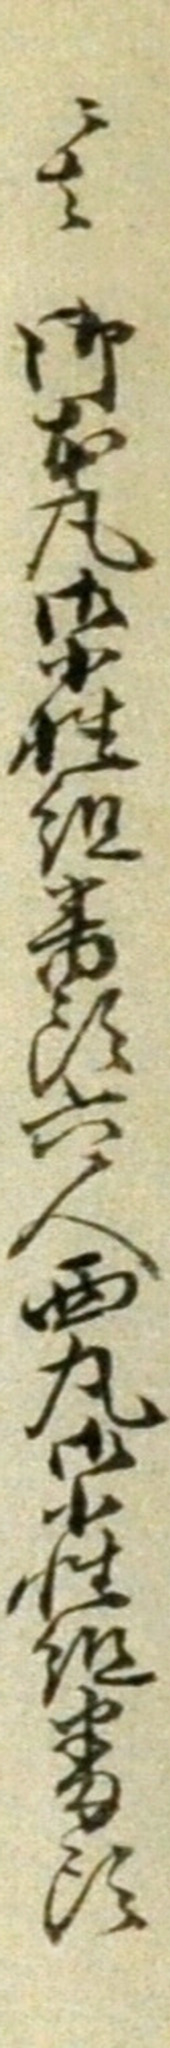ニ者御本丸御小姓組番頭六人西丸御小姓組番頭
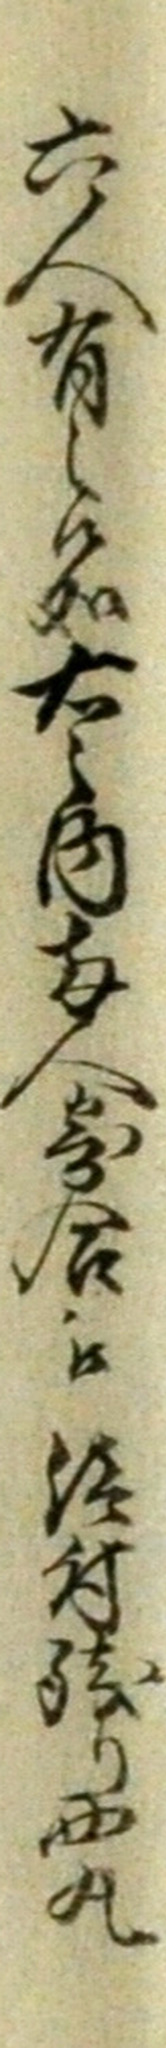六人有之候処右之内両人寄合被仰付残リ西丸
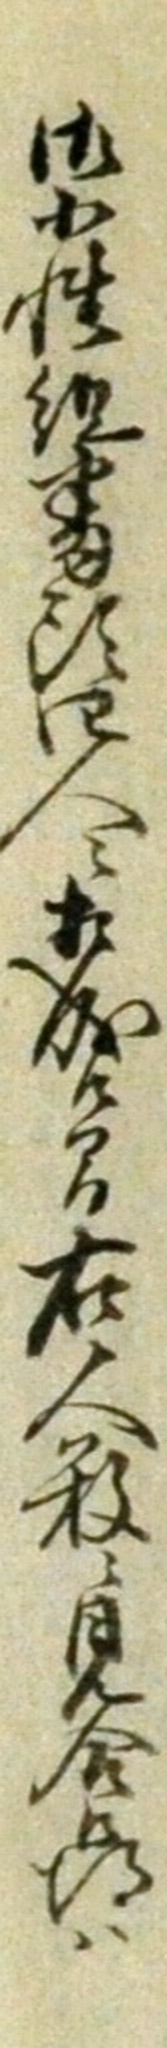御小姓組番頭四人ニ相成候間右人数ニ見合候得ハ
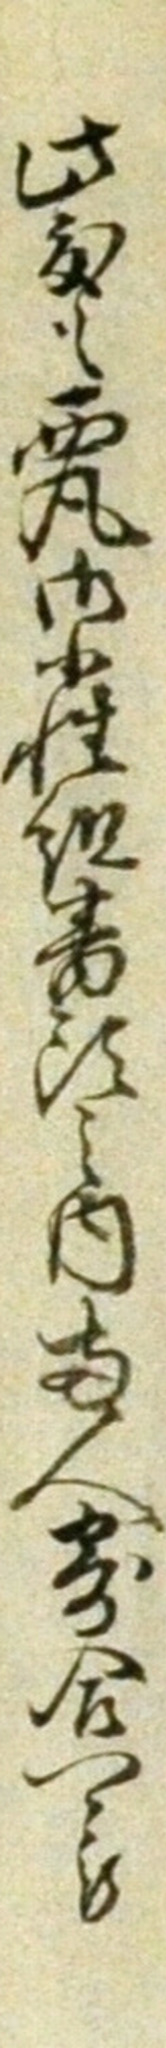此度も西丸御小姓組番頭之内両人寄合可被
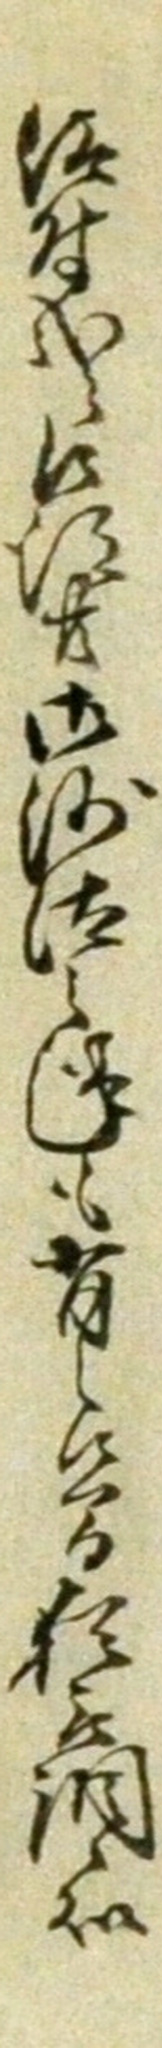仰付哉ニ候得共御沙汰之趣も有之候間猶取調候処
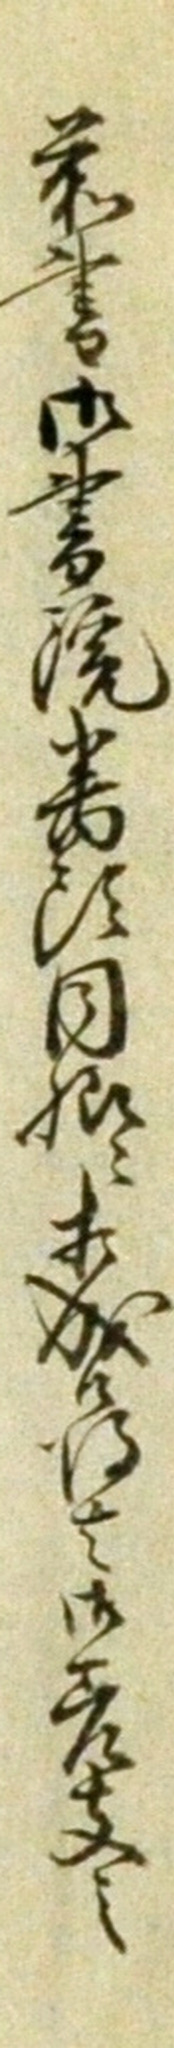前書御書院番頭同様ニ相成候得者御差支之
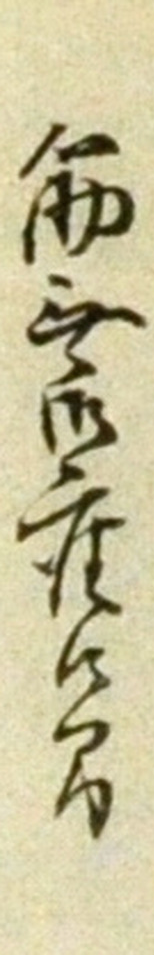筋無御座候間
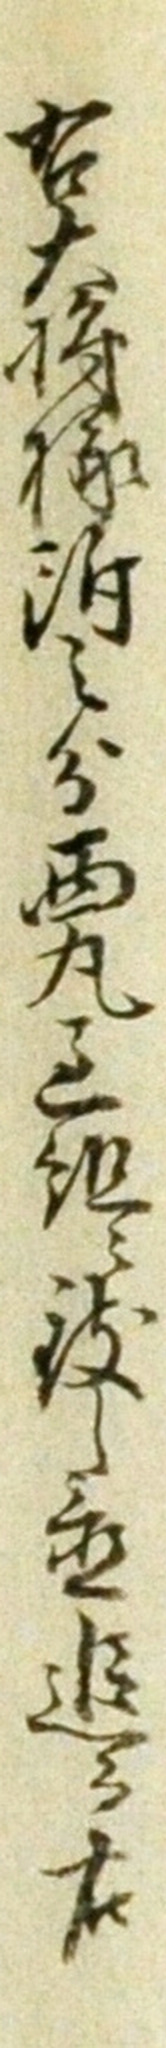右大将様附之文西丸過組ニ致置追而右
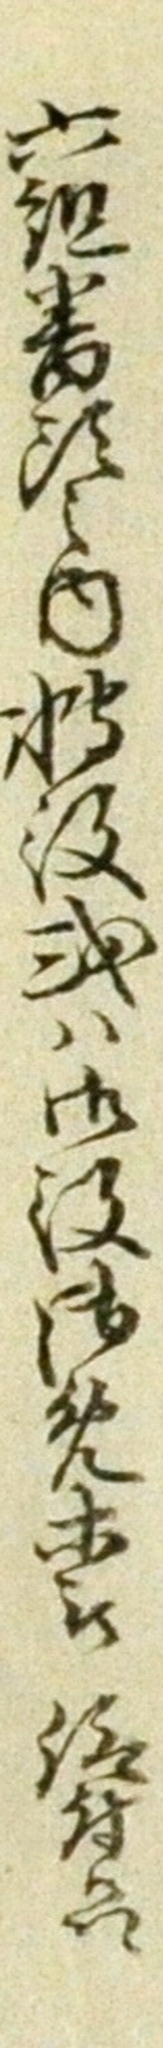六組番頭之内轉役或ハ御役御免等被仰付候ハゝ
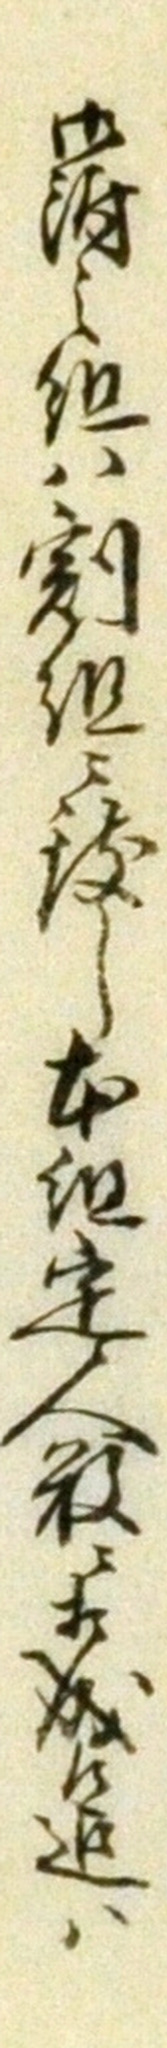御附之組ハ割組ニ致シ本組定人数ニ相成候迄ハ
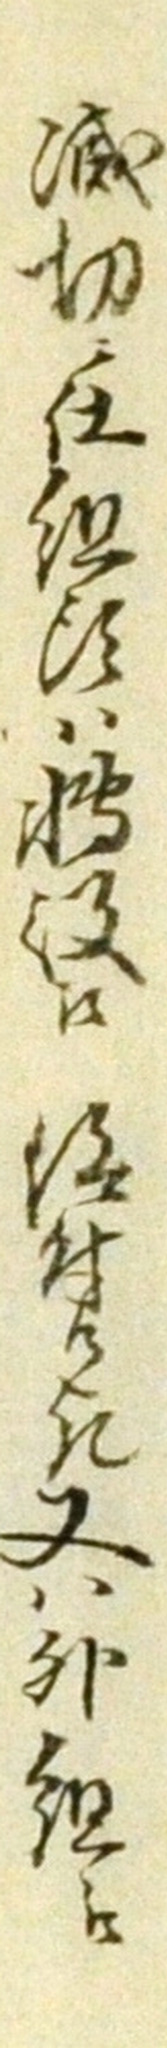滅切ニ仕組頭ハ轉役被仰付候歟又ハ外組江
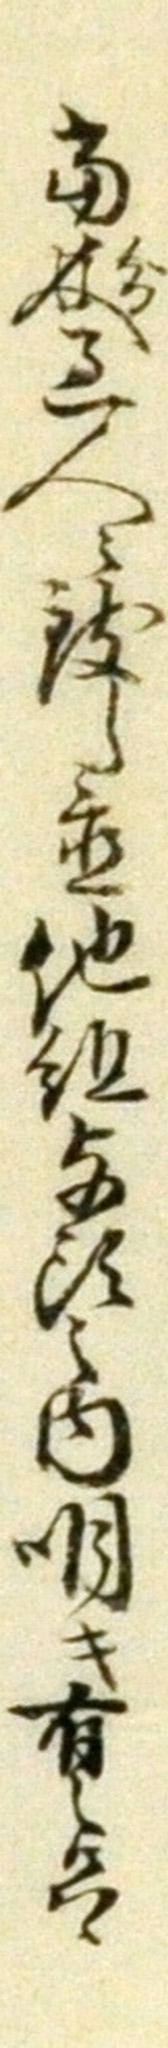当分過人ニ致シ置他組与頭之内明キ有之候ハゝ
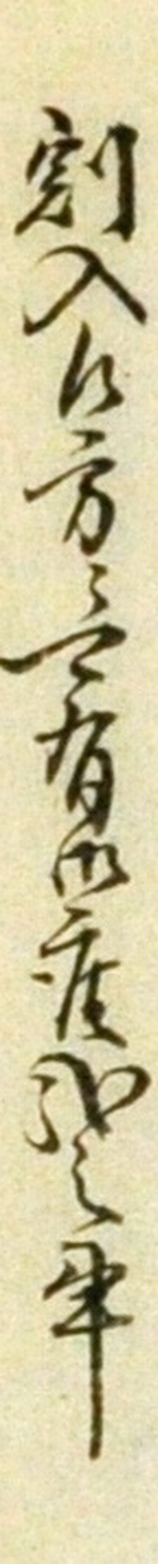割入候方ニ可有御座哉之事
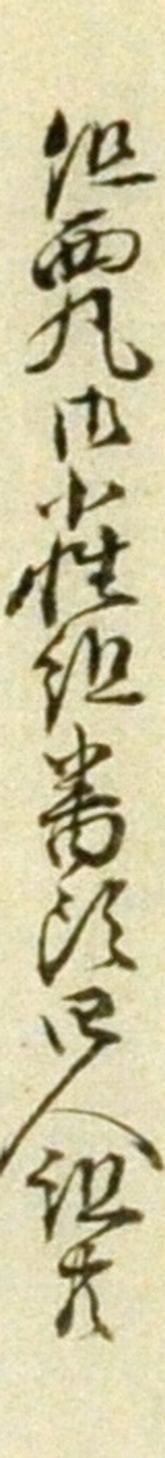但西丸御小姓組番頭四人組共
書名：若年寄御役中御調書付
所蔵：伊那市立高遠町図書館・合同会社AMANE
